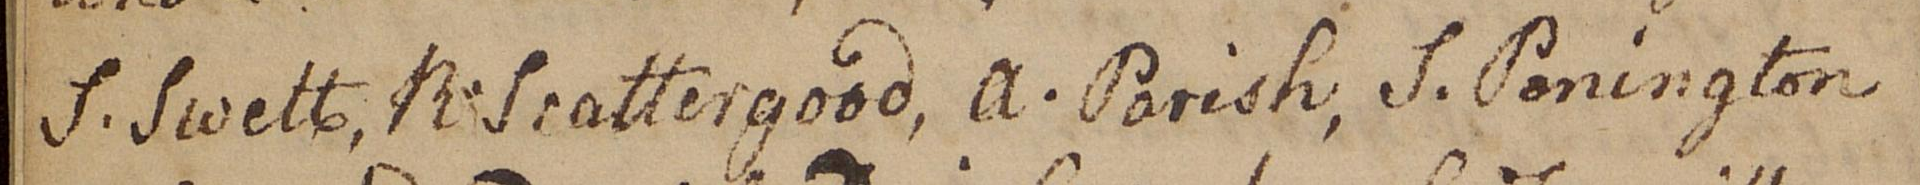S. Swet, R. Scattergood, A. Parish, S. Penington
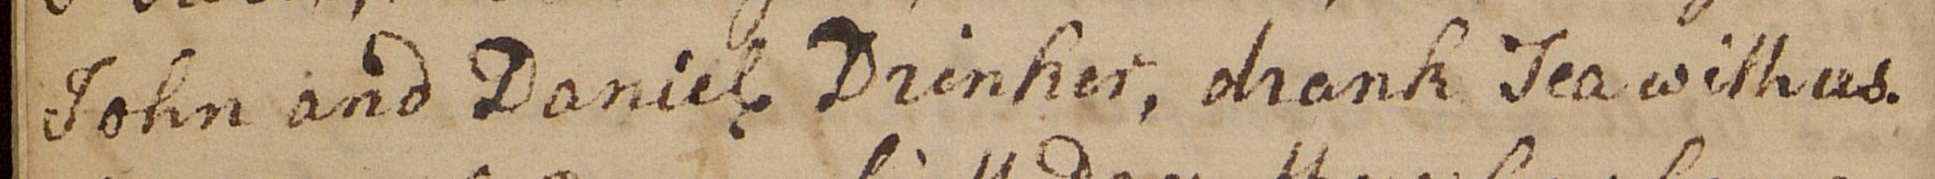John and Daniel Drinker, drank Tea with us.
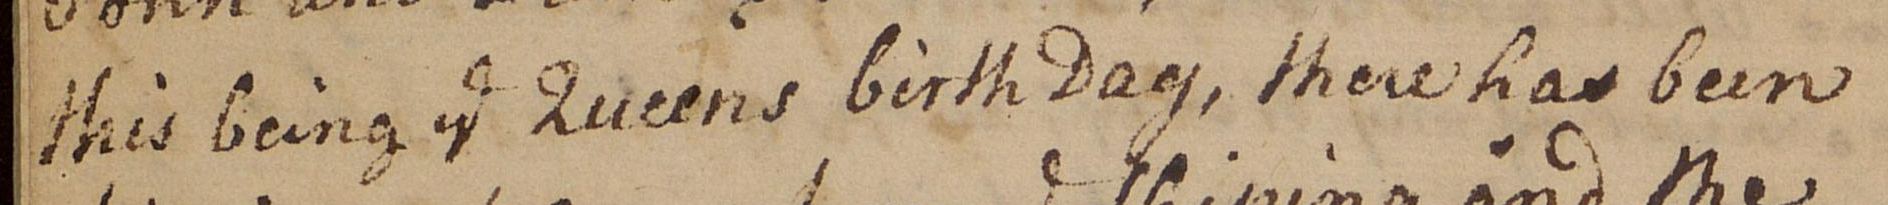this being y^e Queens birth Day, there has been
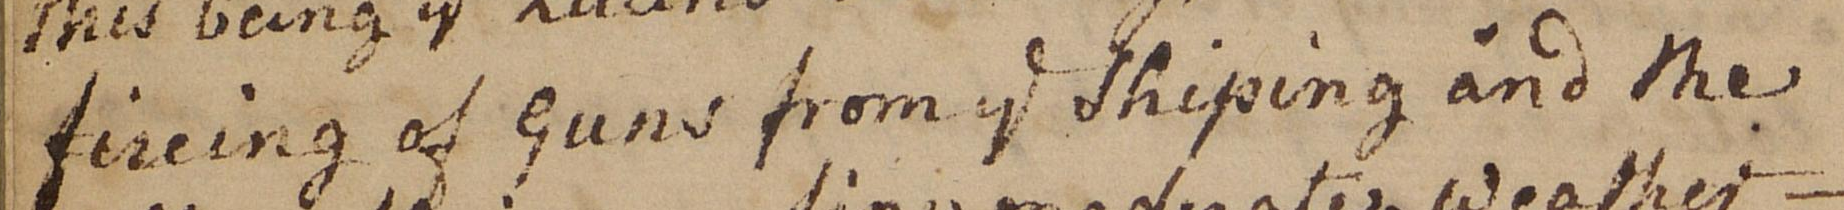fireing of Guns from y^e Shiping and the
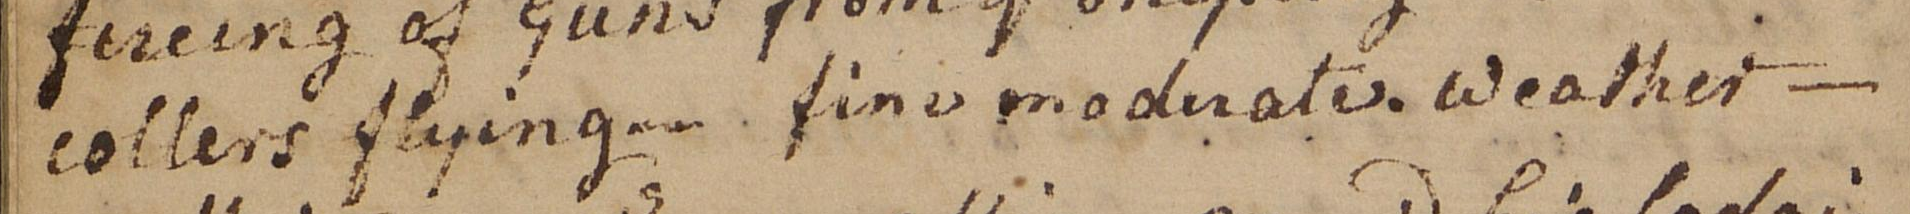collers flying- fine moderate. Weather-
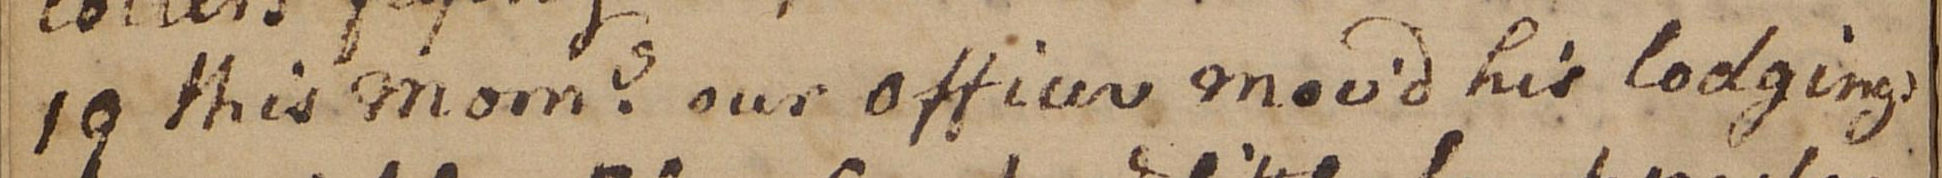19 this Morn^g. our Officer mov'd his lodgings
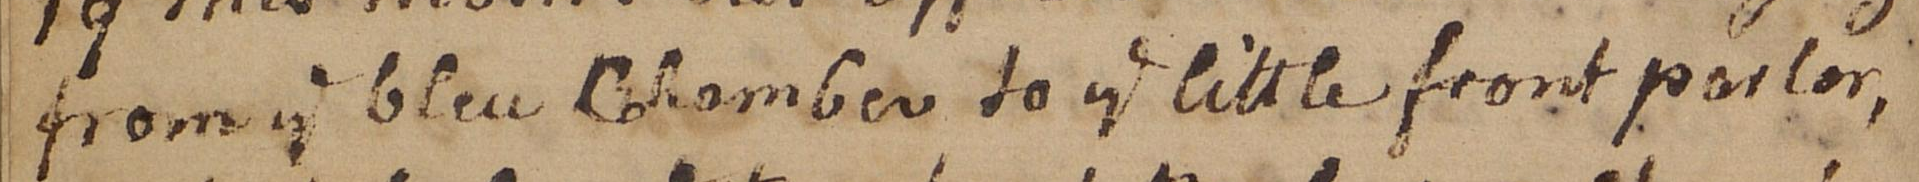from y^e bleu Chamber to y^e little front parlor,
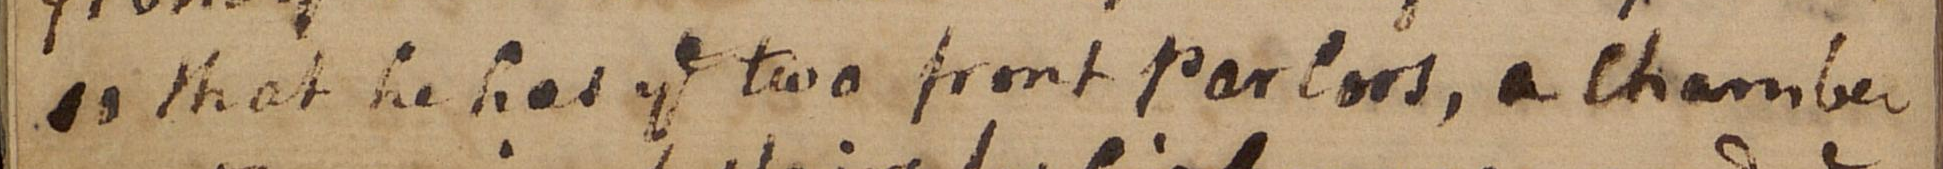s0 that he has y^e two front Parlors, a Chamber
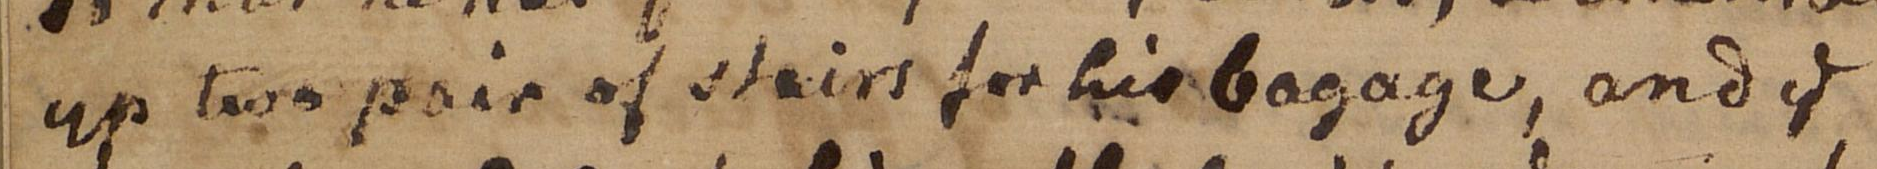up two pair of stairs for his bagage, and y^e
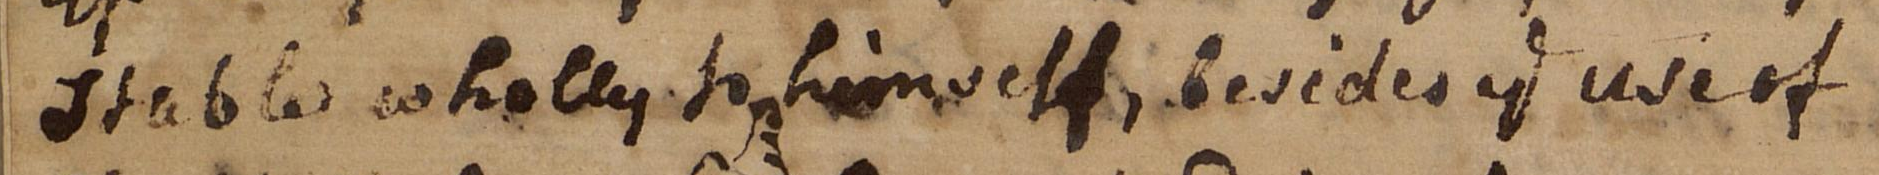stable wholly to himself, besides y^e use of
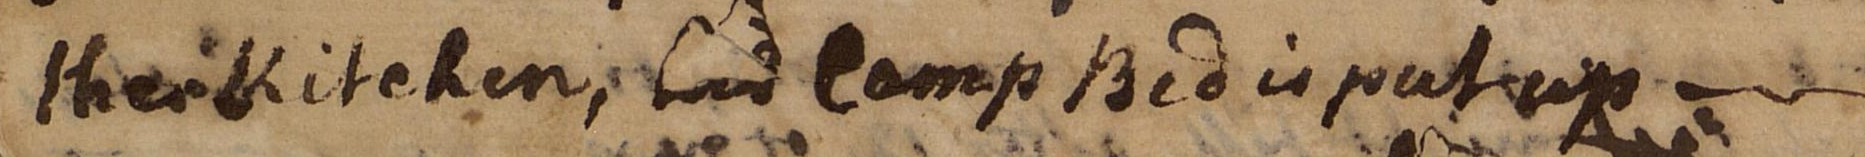the Kitchen, [___] Camp Bed is put up-
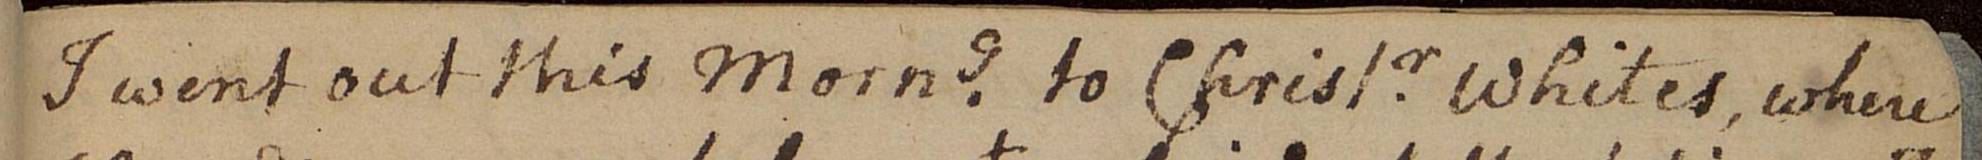I went out this Morn^g. to Christ^r. Whites, where
